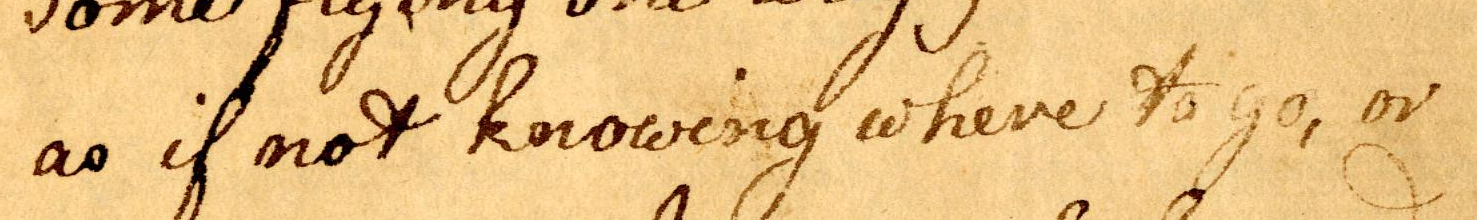as if not knowing where to go, or
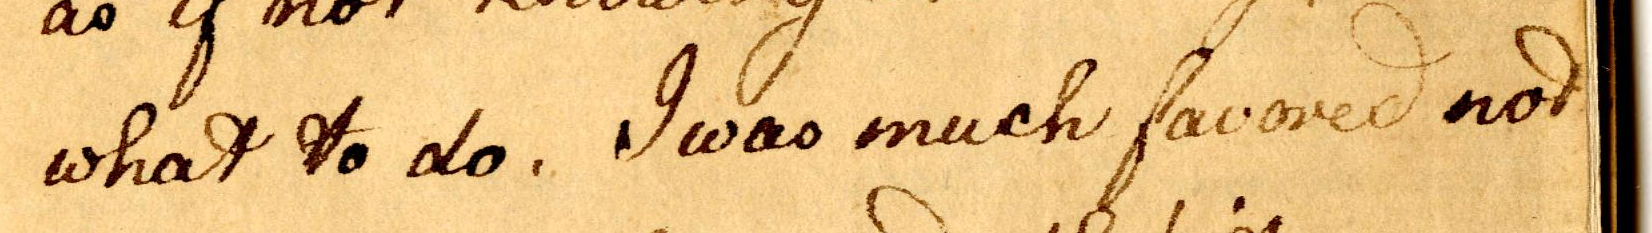what to do, I was much favored not
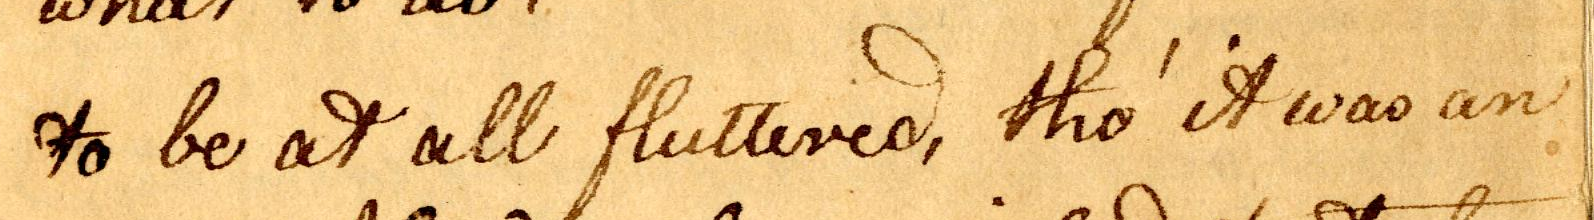to be at all fluttered, tho' it was an
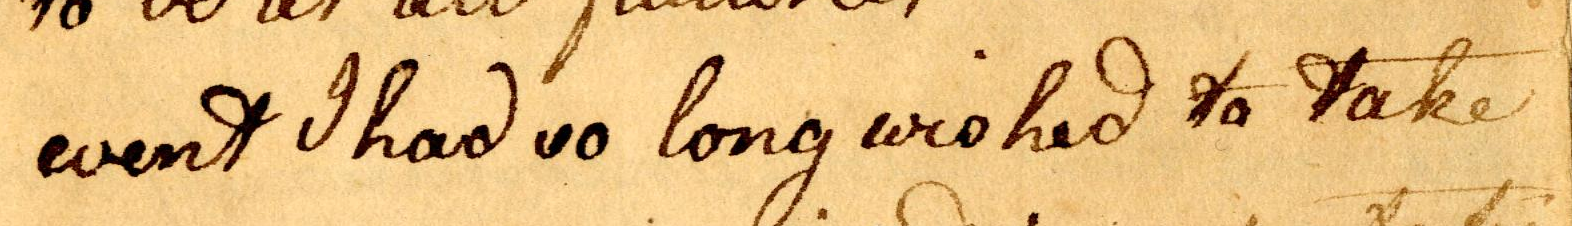event I had so long wished to take
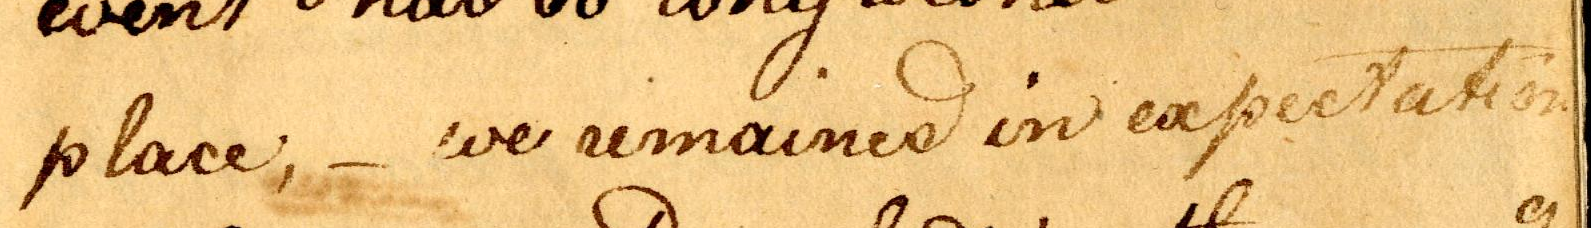place,- we remained in expectation
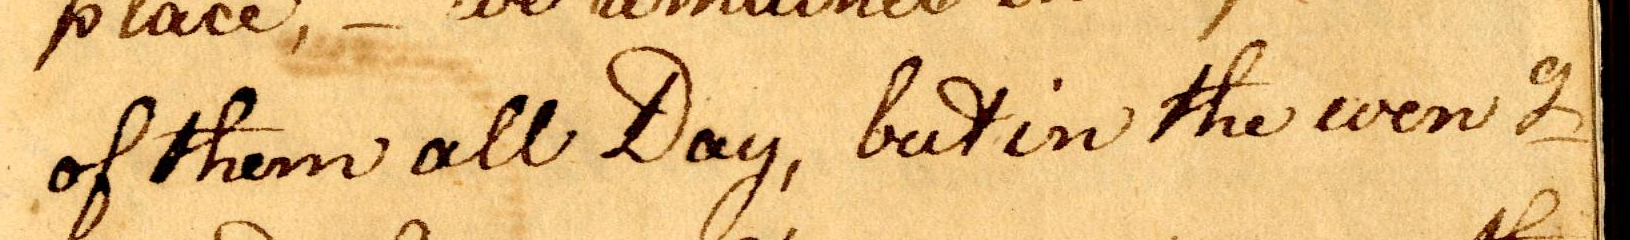of them all Day, but in the even^g
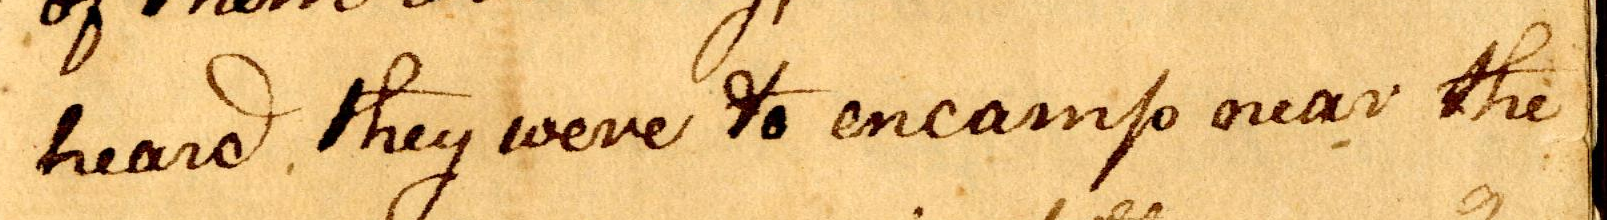heard they were to encamp near the
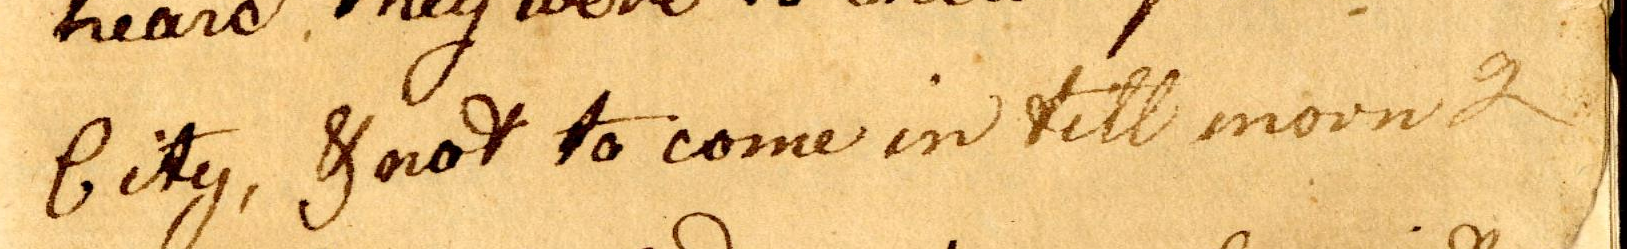City, & not to come in till morn^g
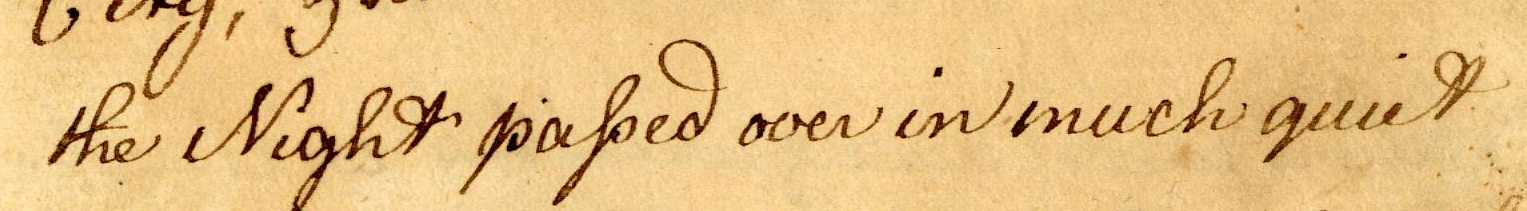the Night passed over in much quiet
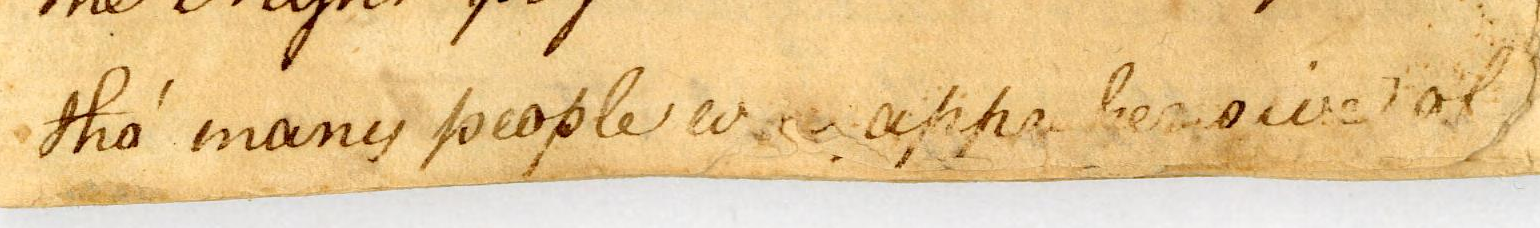tho' many people were apprehensive of
